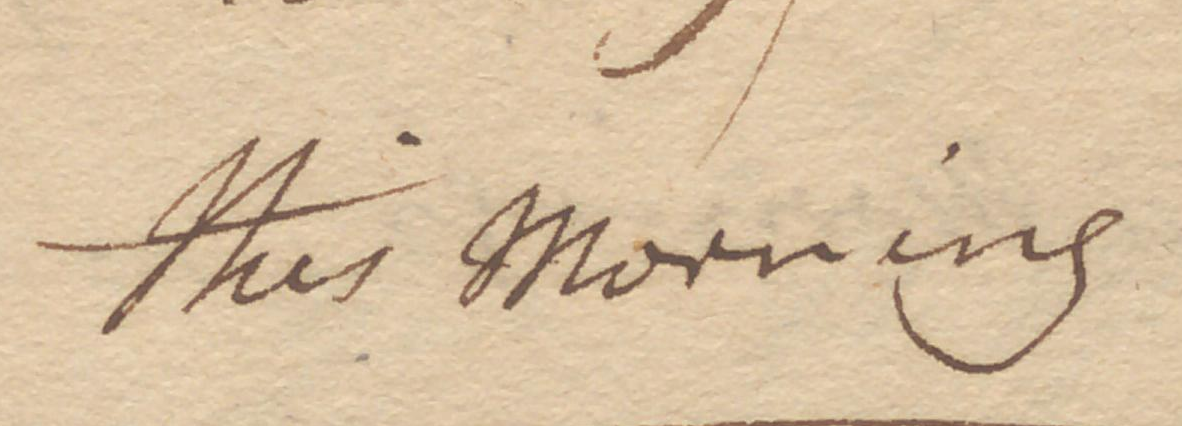this Morning
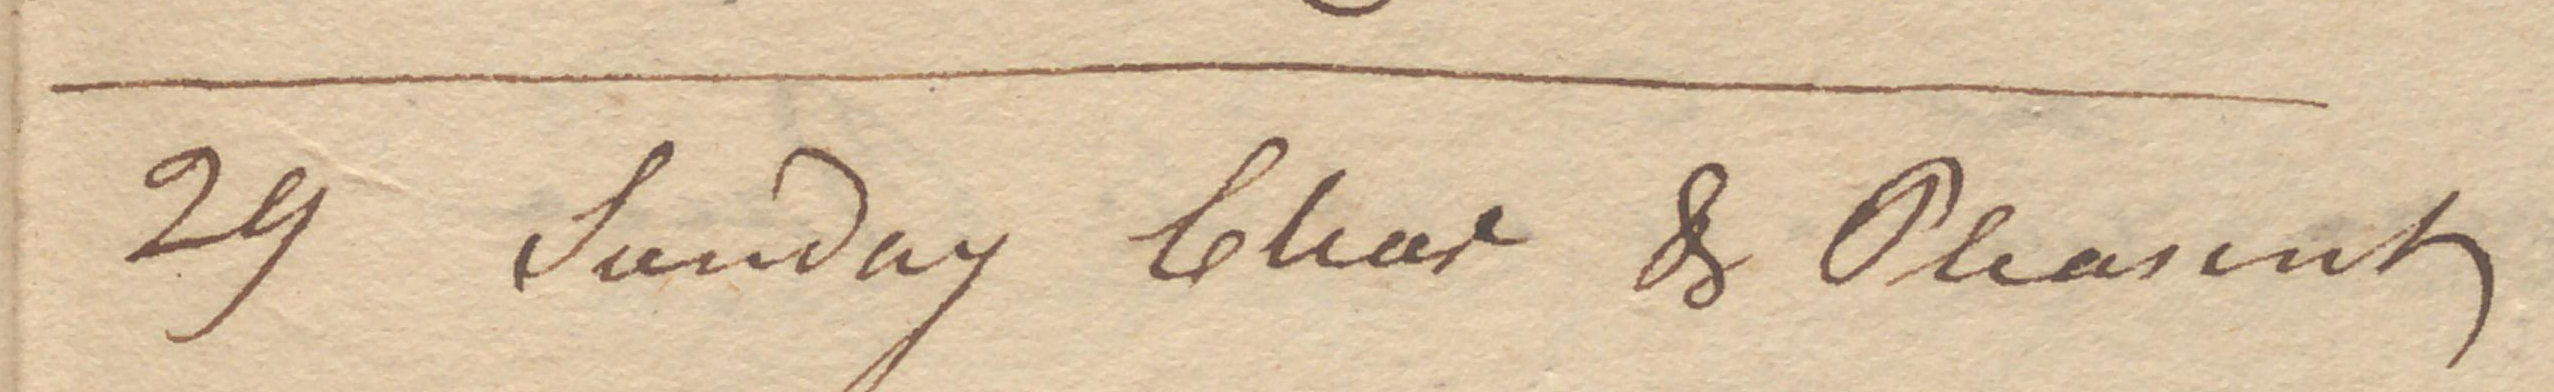29 Sunday Clear & Pleasent
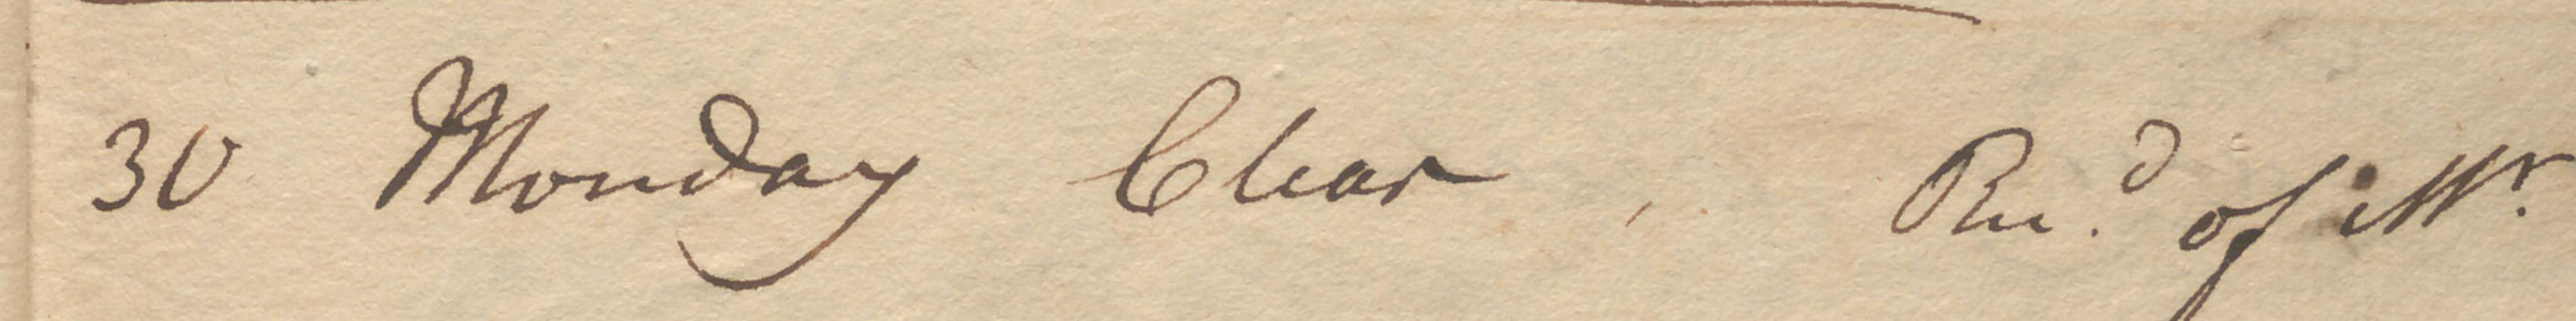30 Monday Clear Rec^d. of M^r.
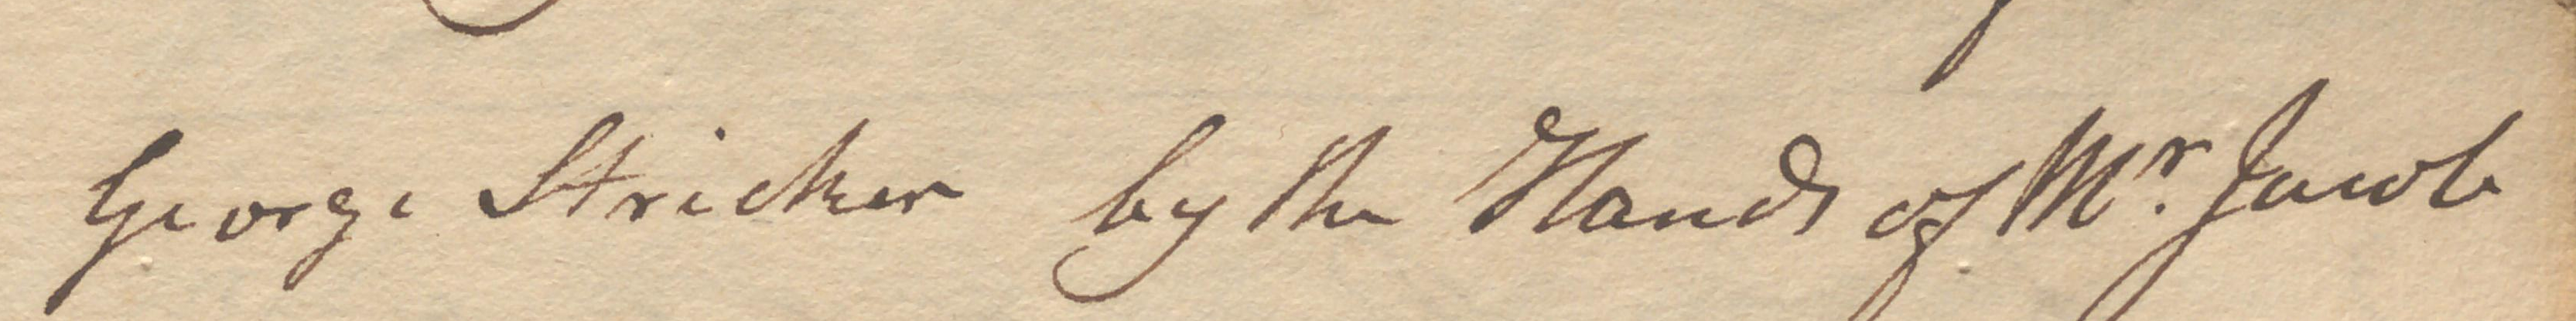George Stricker by the Hands of M^r. Jacob
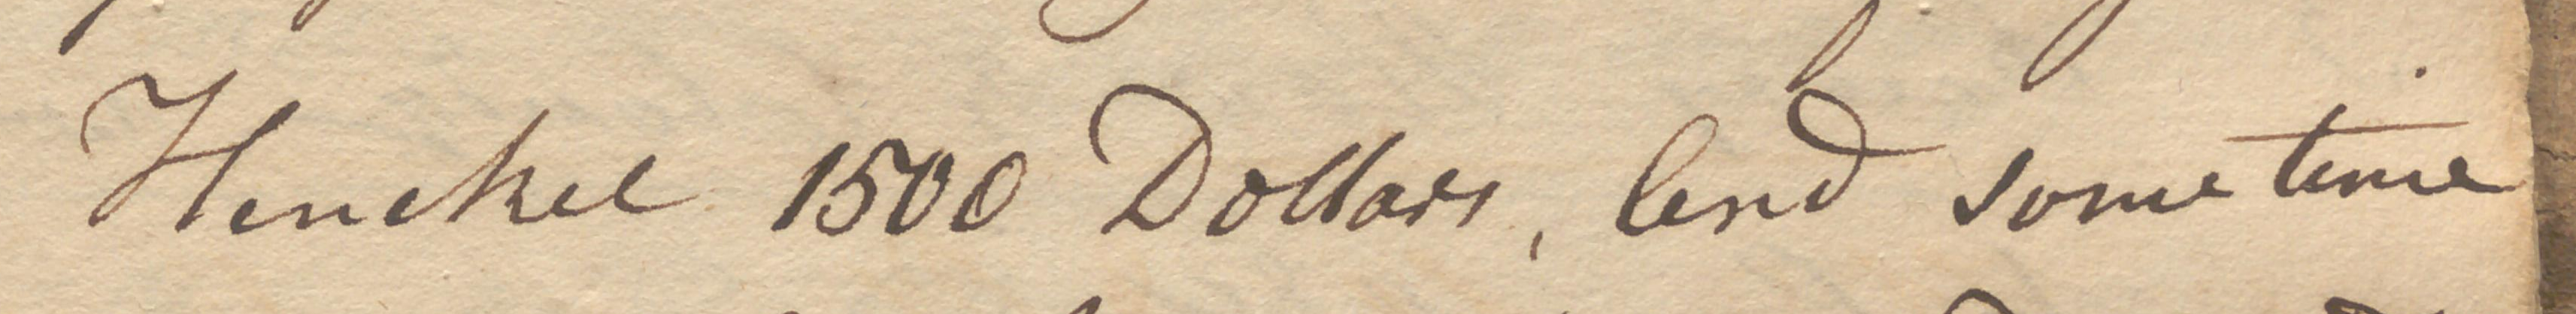Henckel 1500 Dollars, lend some time
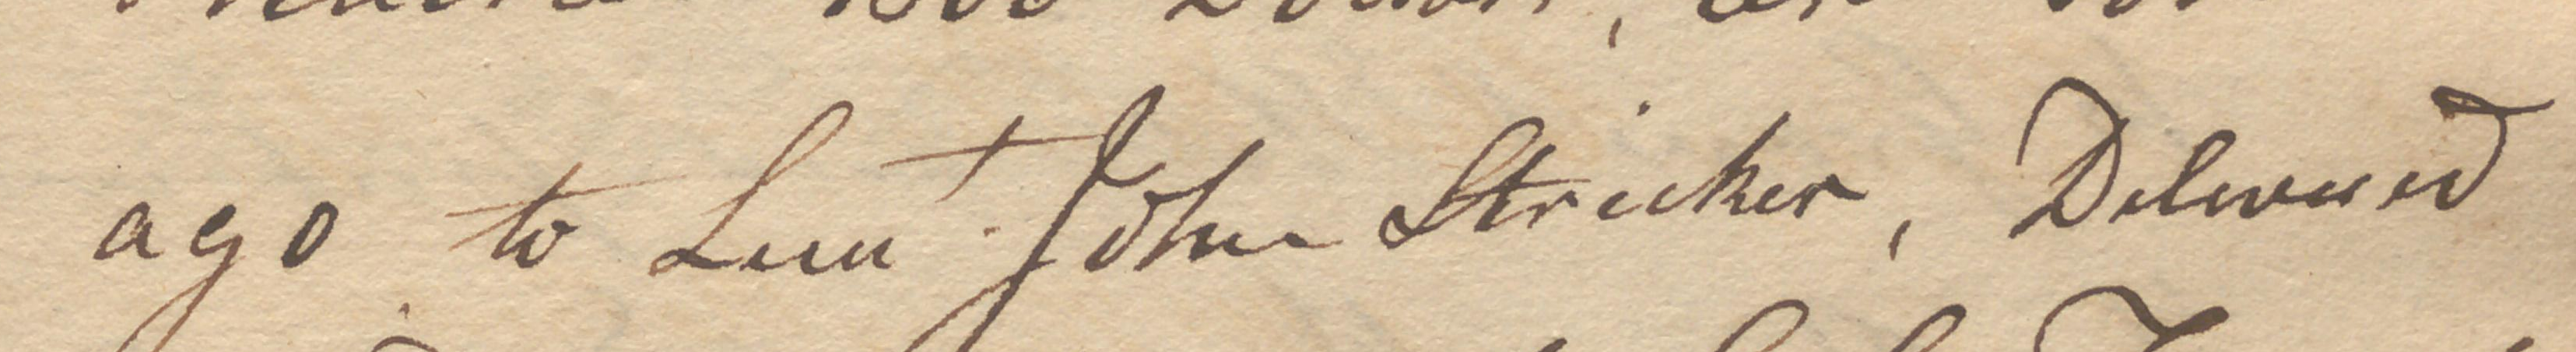ago to Lieu^t John Stricker, Delivered
